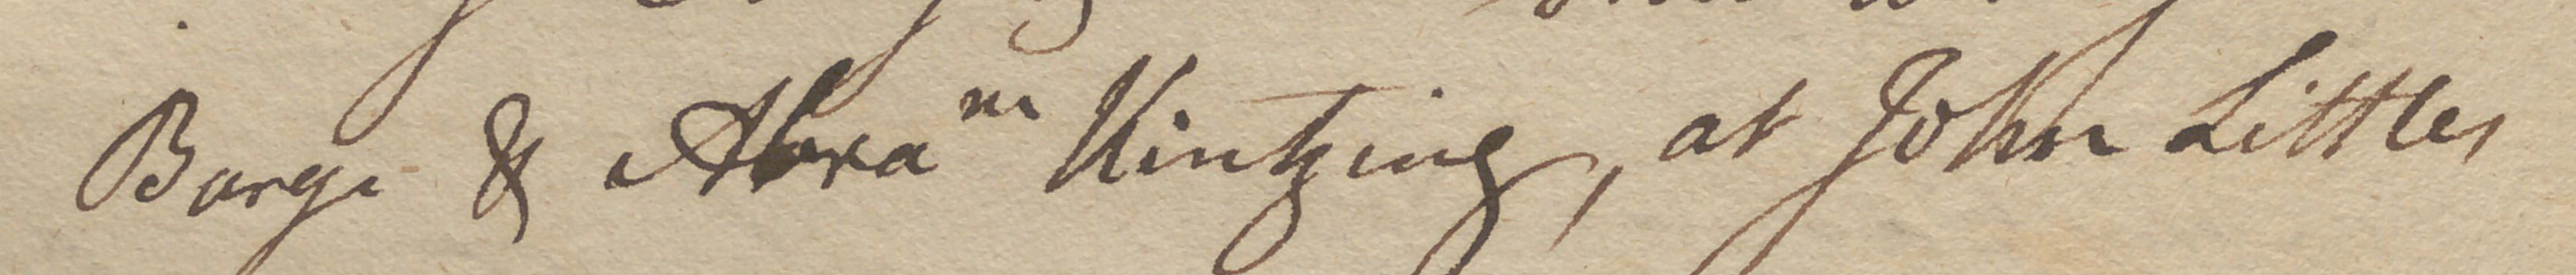Barge & Abra^m. Kintzing at John Littles
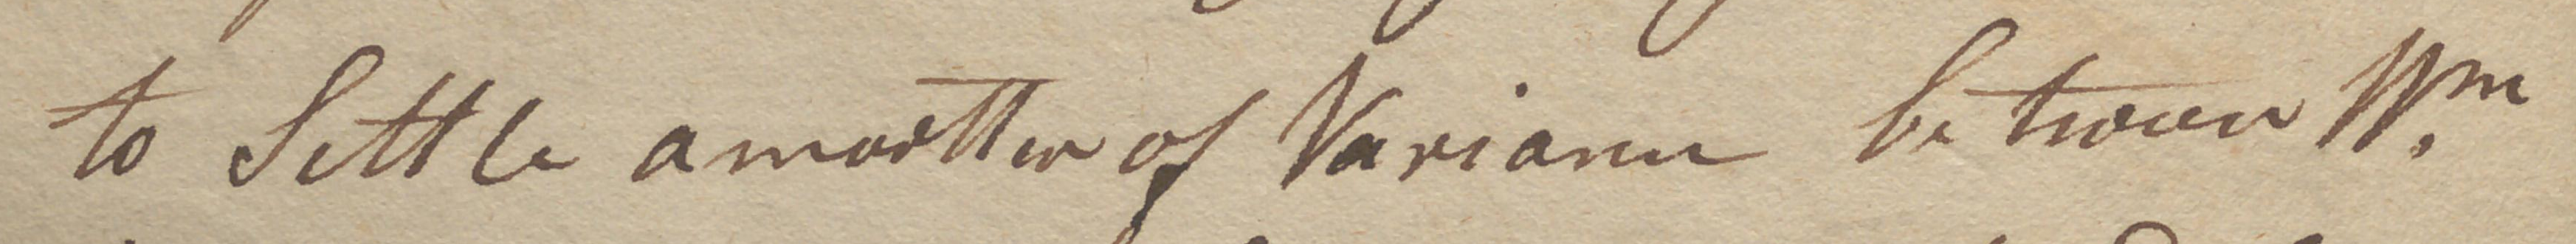to Settle a martter of Variance betwen W^m.
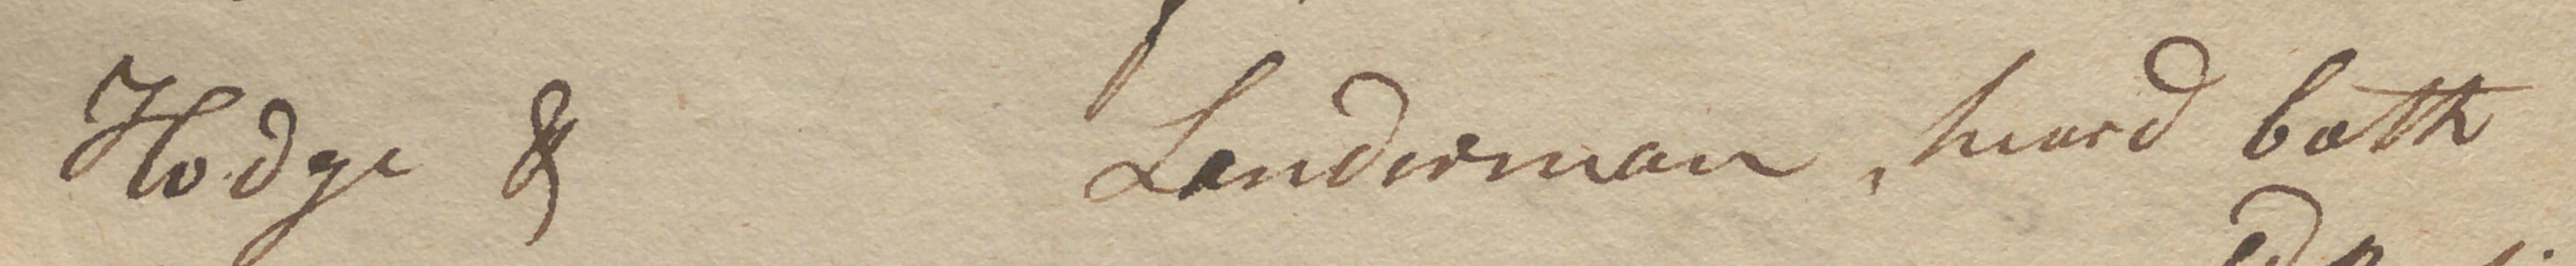Hodge & Landerman, heard both
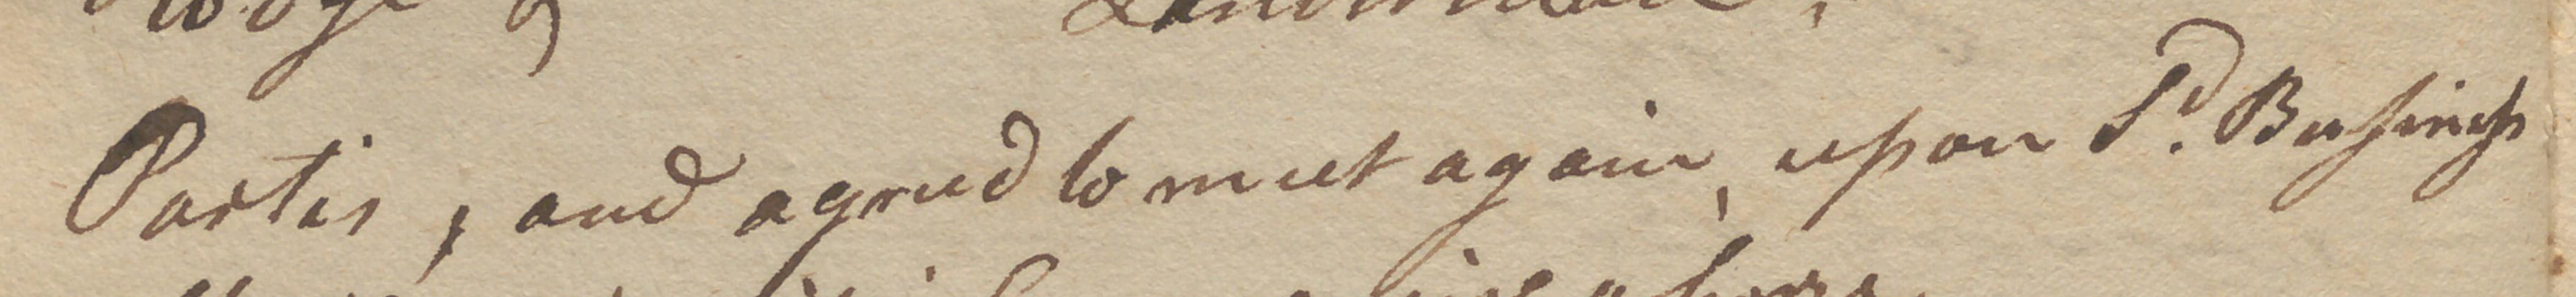Partis, and agreed to meet again, upon s^d. Business
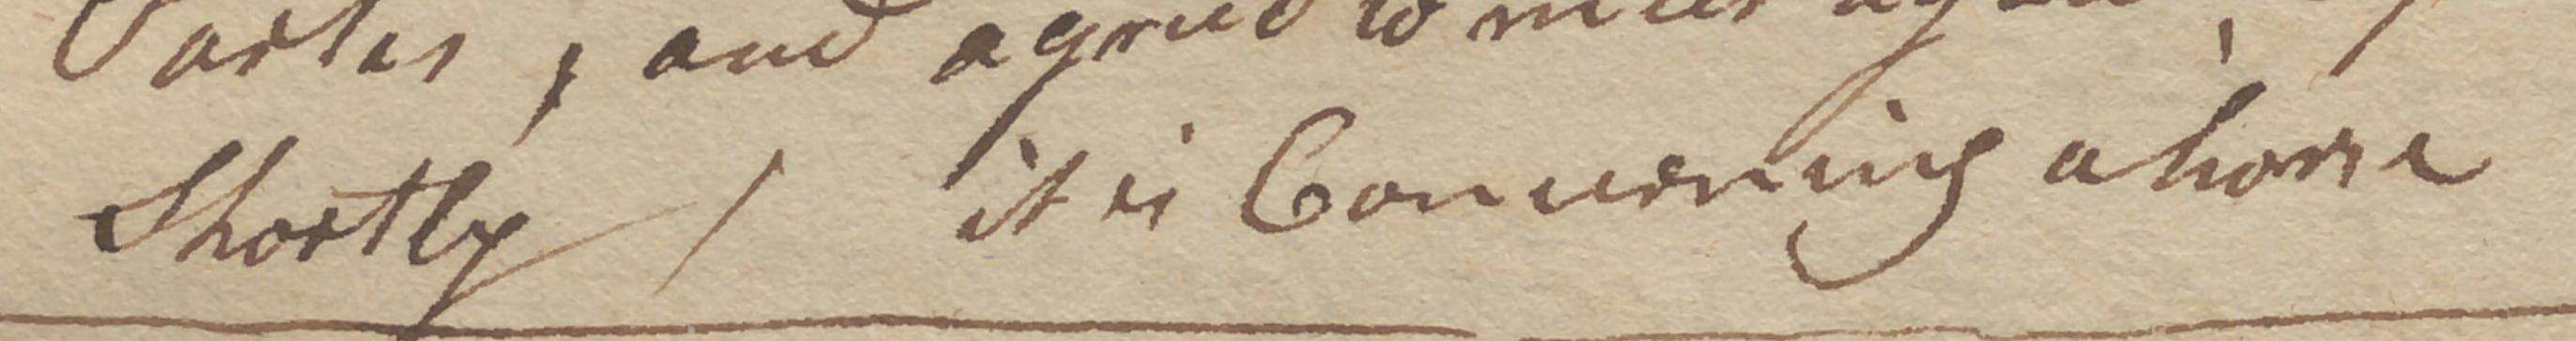Shortly / it is Concerning a horse
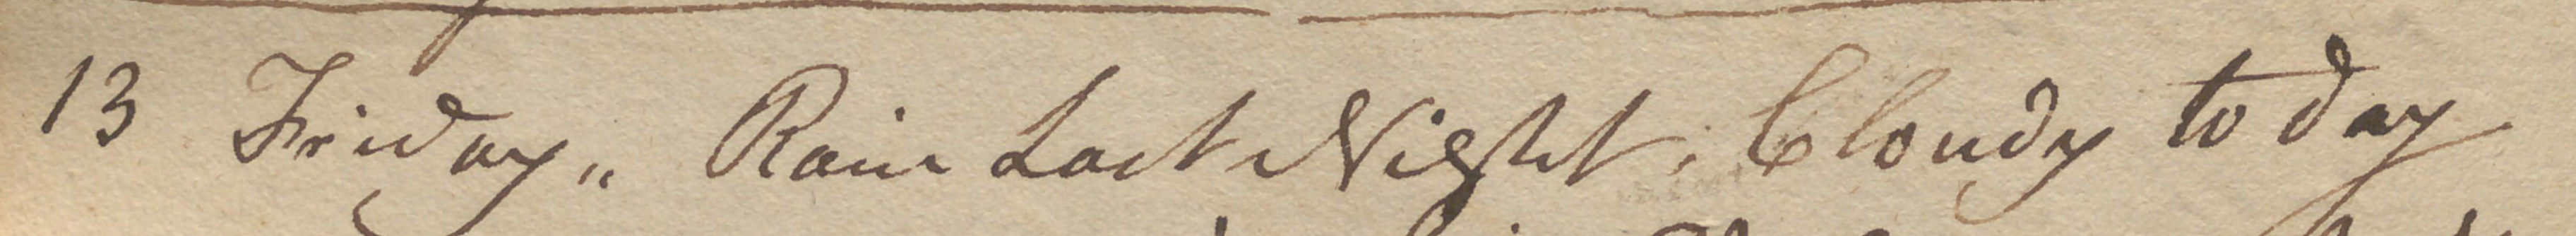13 Friday.. Raine Last Night, Cloudy to day
